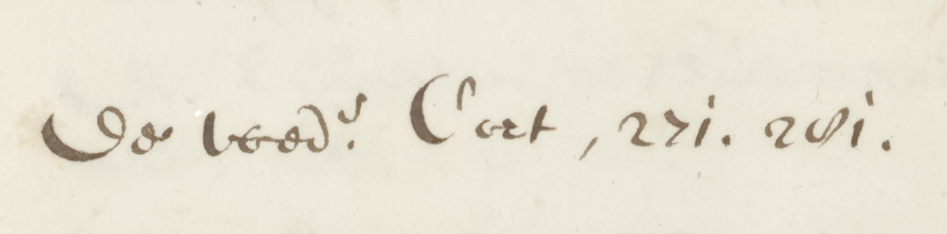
De wede. Cort, 271, 281.
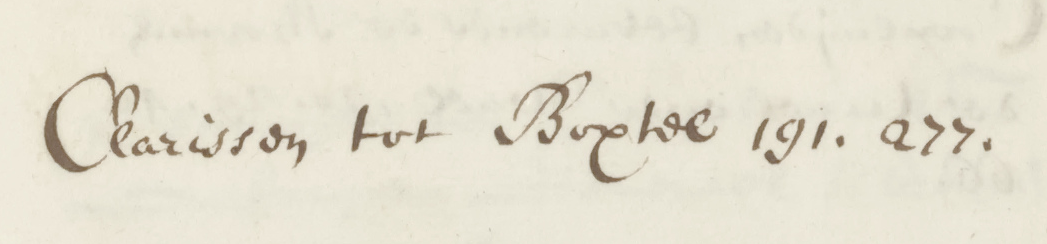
Clarissen tot Boxtel 191, 277.
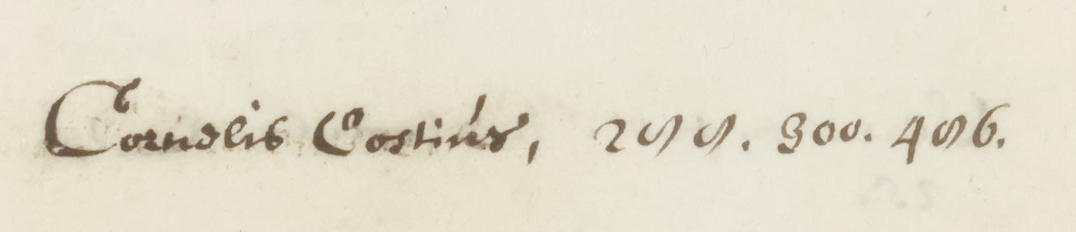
Cornelis Costius, 288, 300, 486.
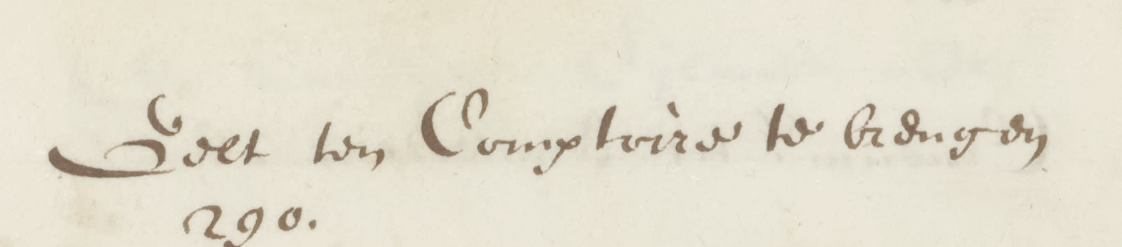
Gelt ten Comptoire te brengen
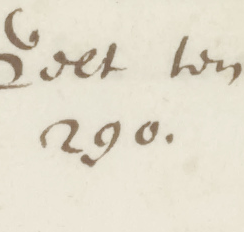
290.
